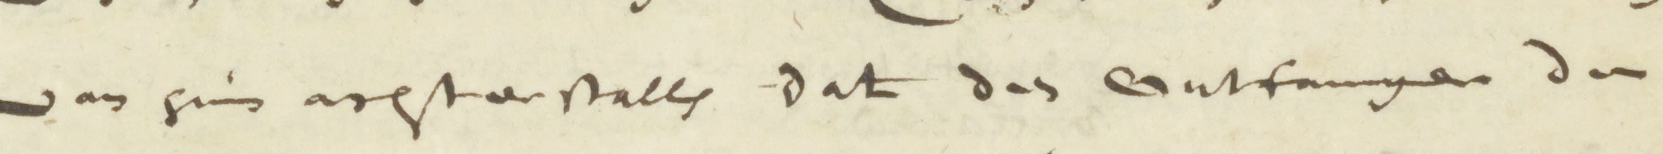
van hun achterstallen dat den Ontfanger de
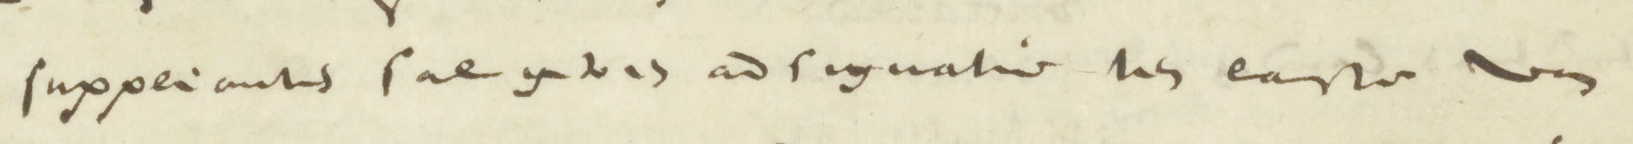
supplianten sal geven adsignatie ten laste van
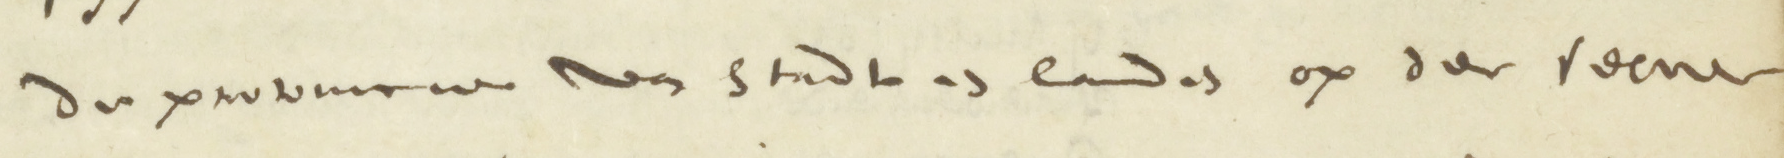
de provincie van Stadt en landen op der selve
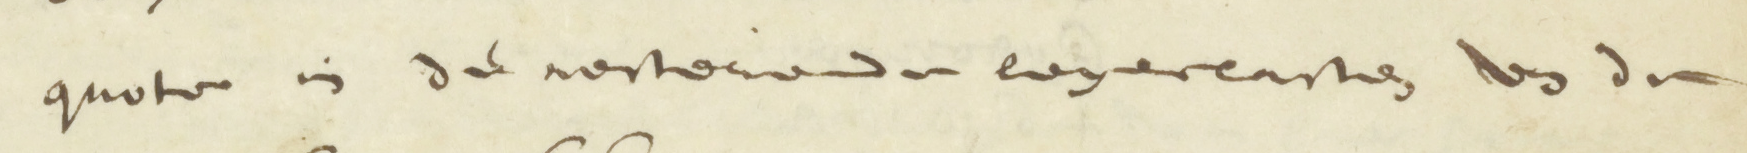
quote in de resterende legerlasten van den
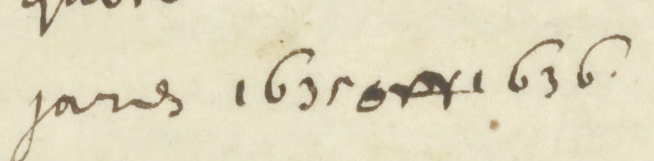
jaren 1635 off 1636.
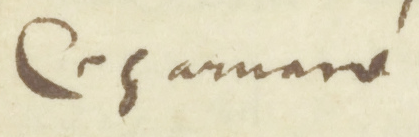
Charnacé
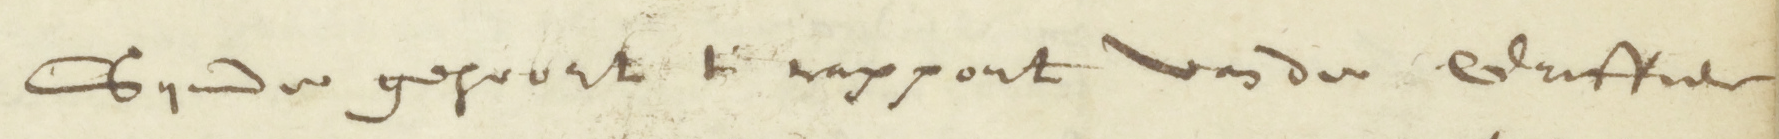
Synde gehoort t' rapport vande Griffier
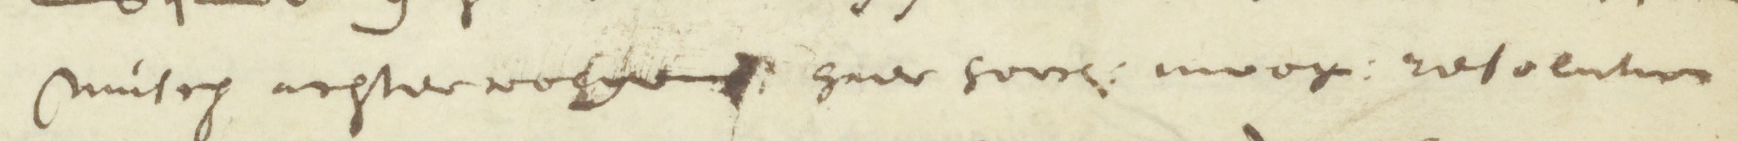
Musch achtervolgens haer hooch: moog: resolutie
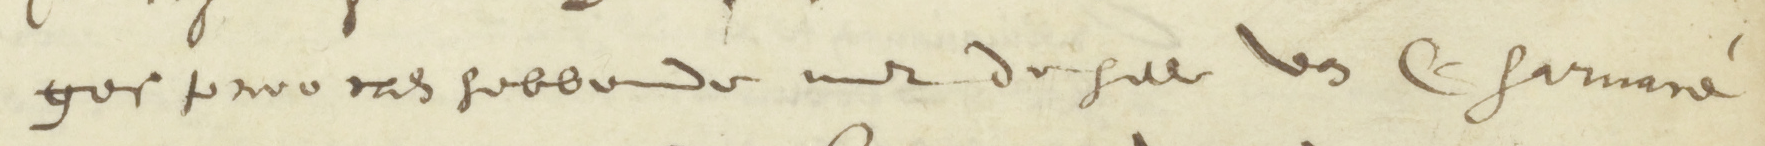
gesproocken hebbende met de heer van Charnacé
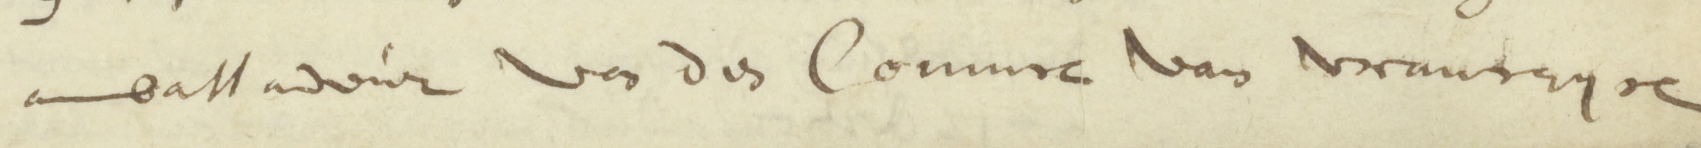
ambassadeur van den Coninck van Vrancrijck
